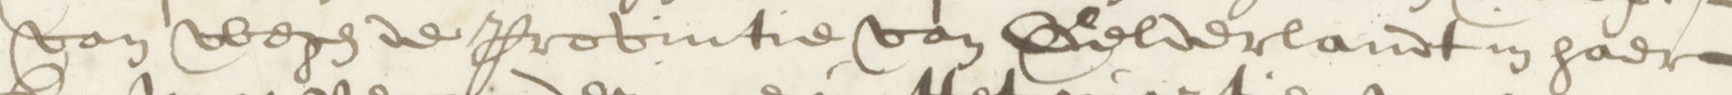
van wegen de Provintie van Gelderlandt in haer
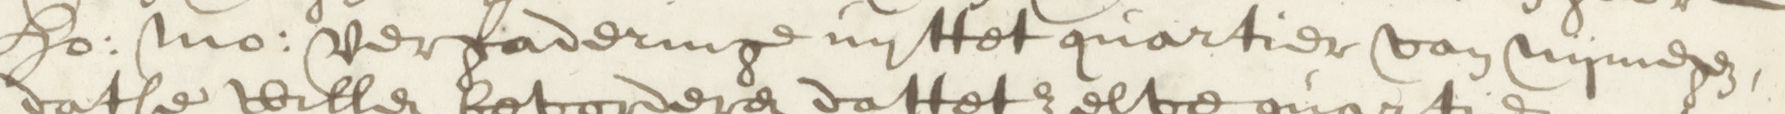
Ho:mo: vergaderinge uijttet quartier van nijmegen
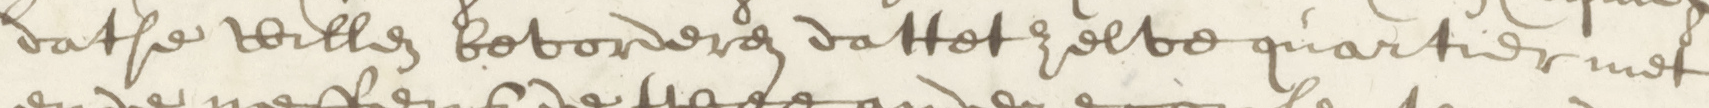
datse willen bevorderen dattet zelve quartier met
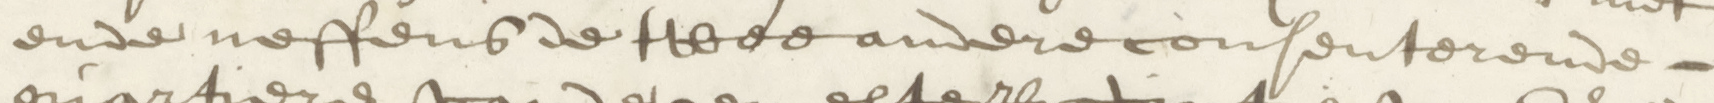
ende neffens de twee andere consenterende
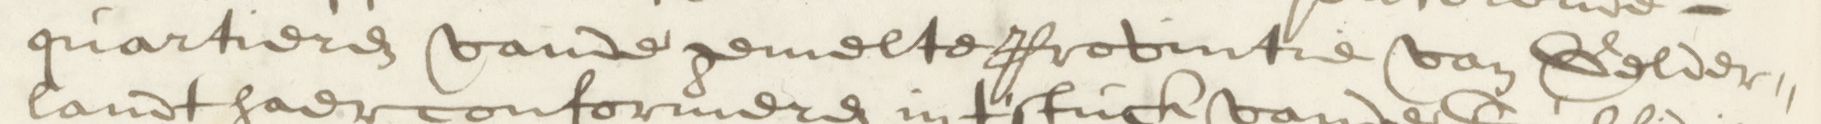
quartieren vande gemelte provintie van Gelder„
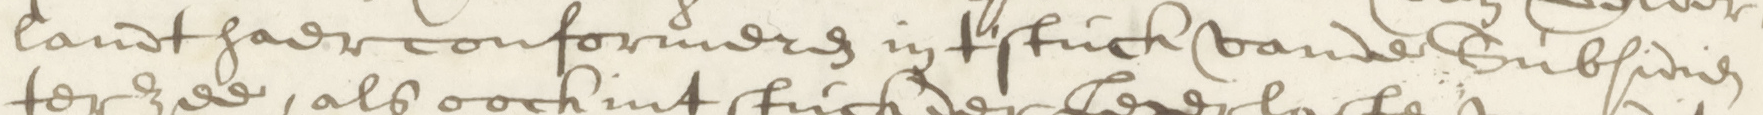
landt haer conformeren in tstuck vande Subsidien
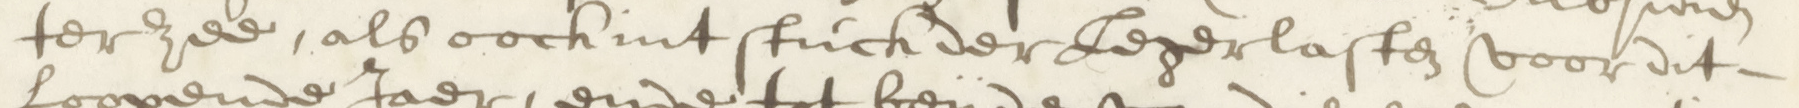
ter zee, als oock int stuck der Legerlasten, voor dit -
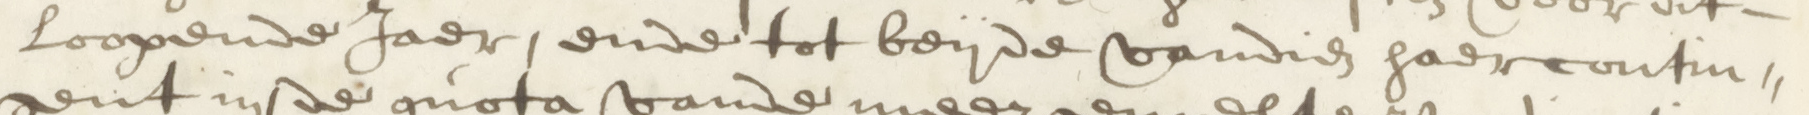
loopende Jaer, ende tot beijde vandien haere contin„
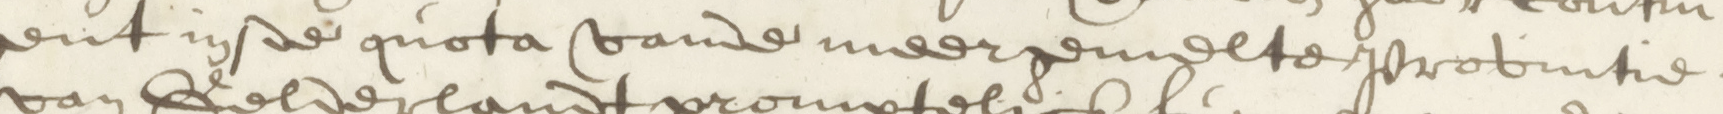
gent in de quota vande meer gemelte Provintie
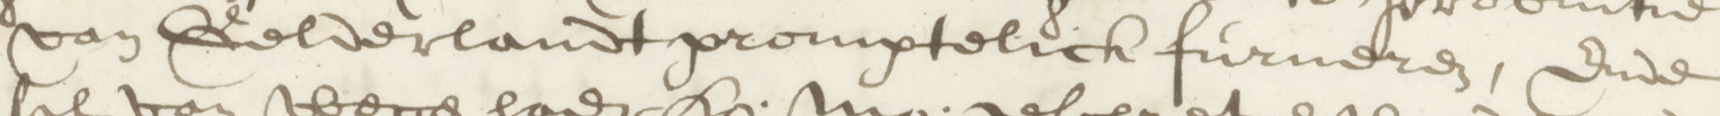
van Gelderlandt promptelick furneren. Ende
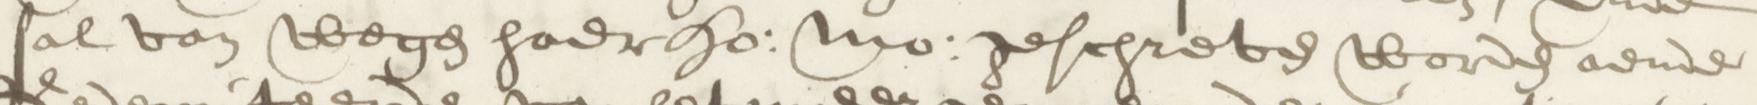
sal van wegen haer Ho:Mo: geschreven worden aende
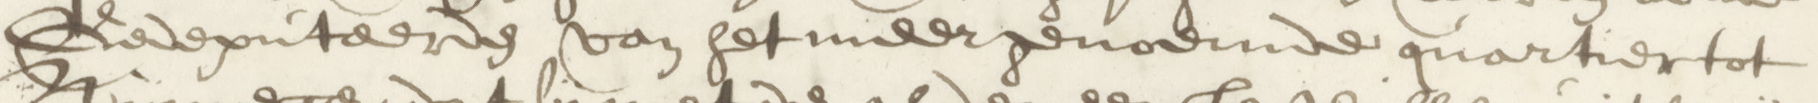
Gedeputeerden van het meer genoemde quartier tot
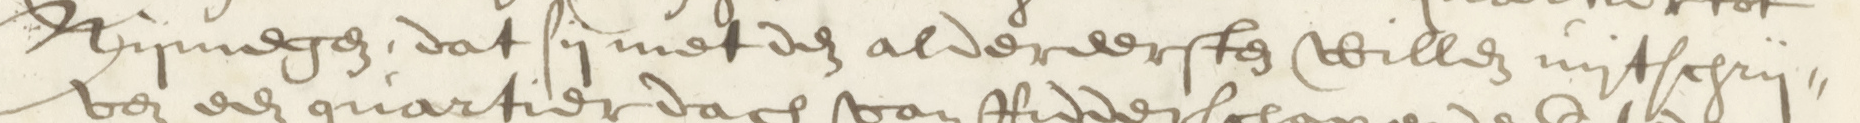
Nijmegen, dat sij met den aldereersten willen uijtschrij„
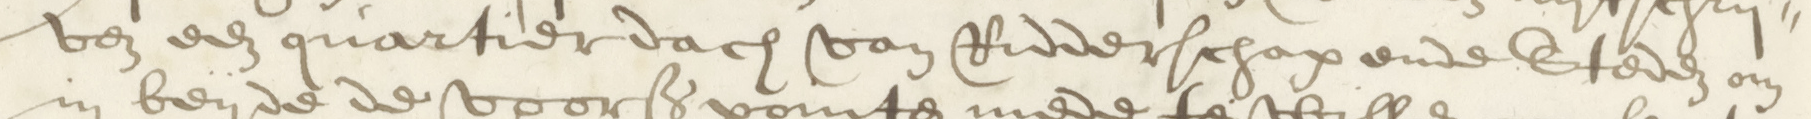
ven een quartierdach van Ridderschap ende Steden om
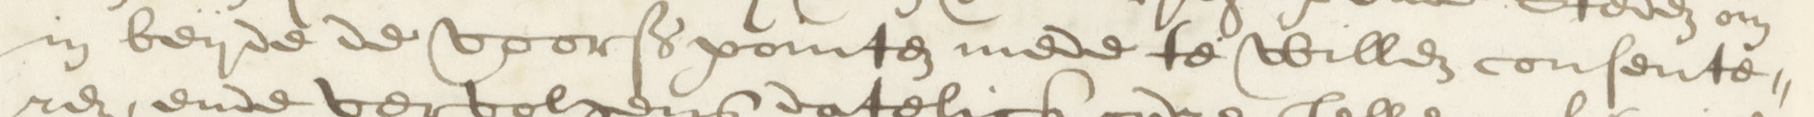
in beijde de voors pointen mede te willen consente„
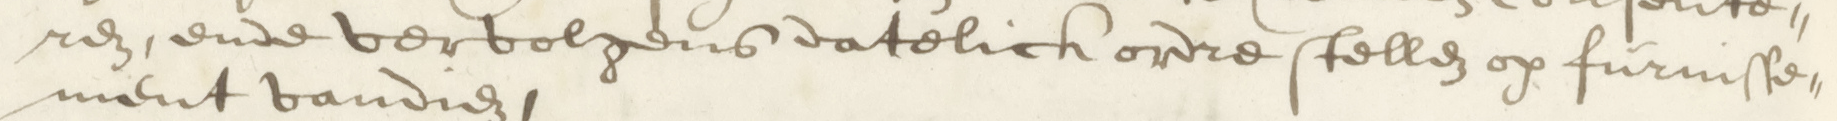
ren ende vervolgens datelick ordre stellen op furnisse„
